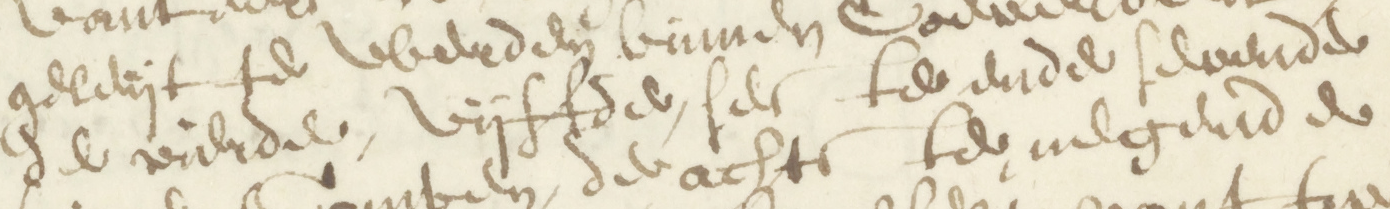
de vierde, vijffde, seste ende sevende
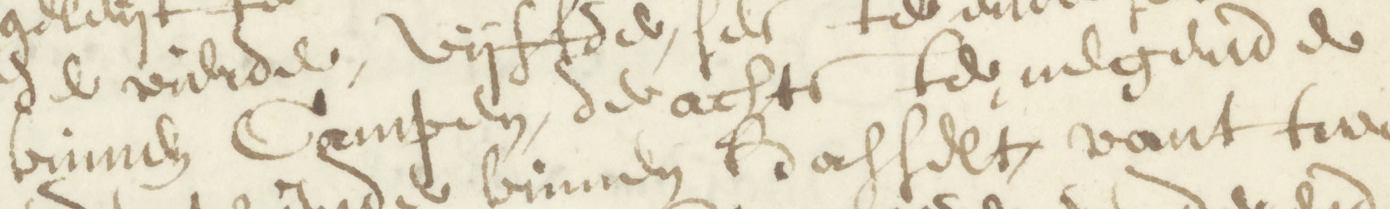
binnen Campen, de achtste negende
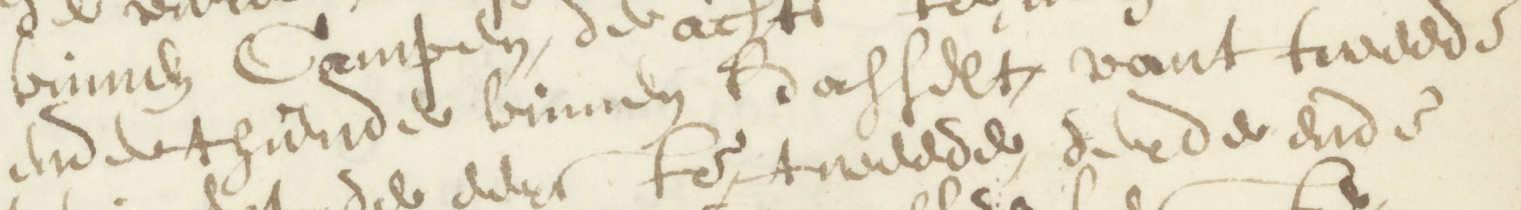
ende thiende binnen Hasselt, vant tweede
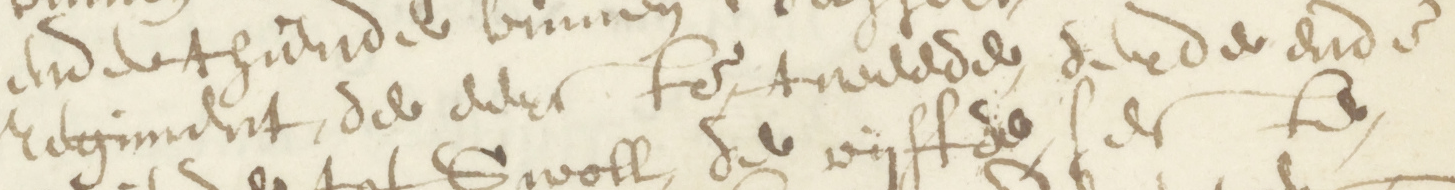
regiment, de eerste tweede derde ende
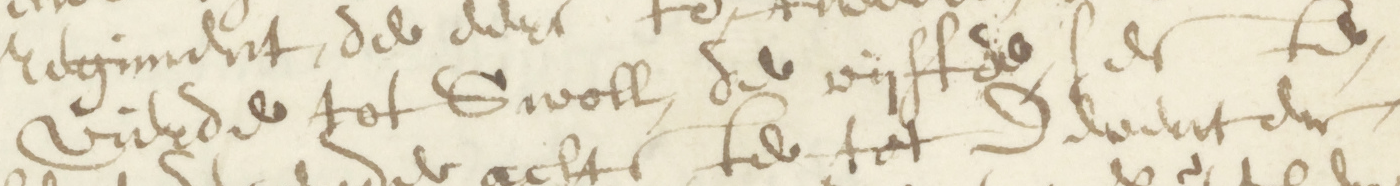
vierde tot Swoll de vijffde seste„
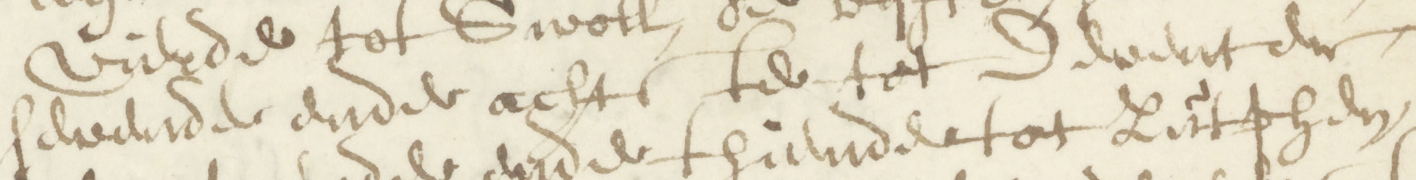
sevende ende achtste tot Deventer,
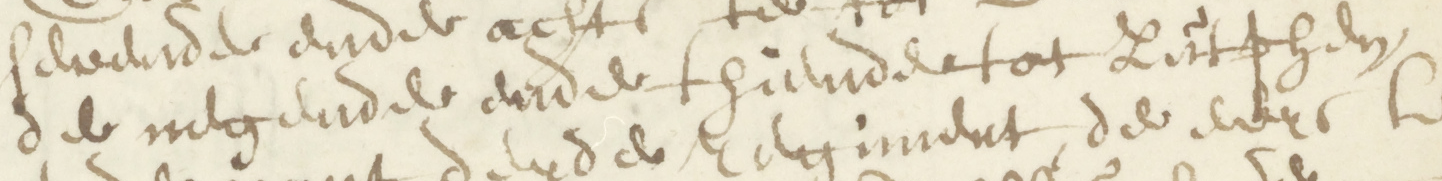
de negende ende thiende tot Zutphen,
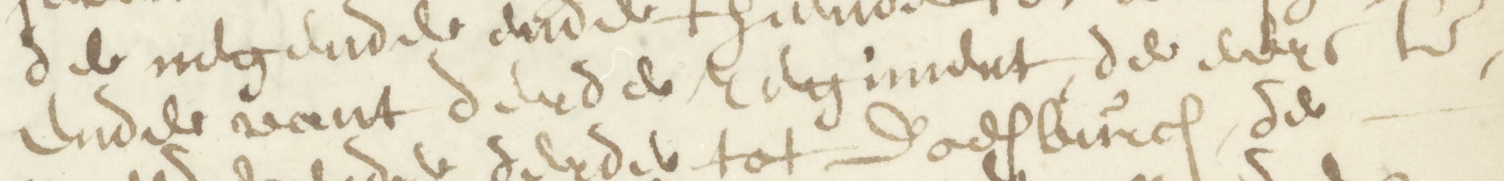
ende vant derde regiment de eerste
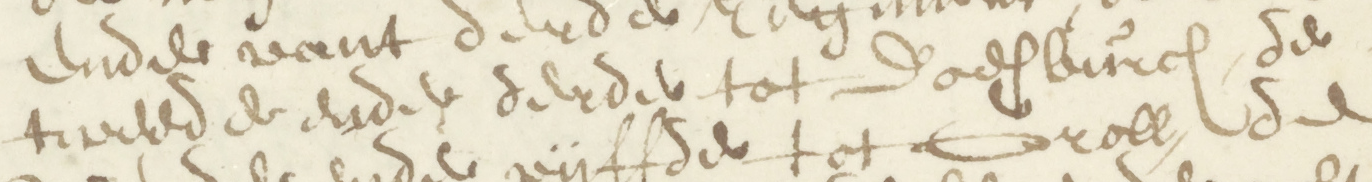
tweede ende derde tot Doesburch, de
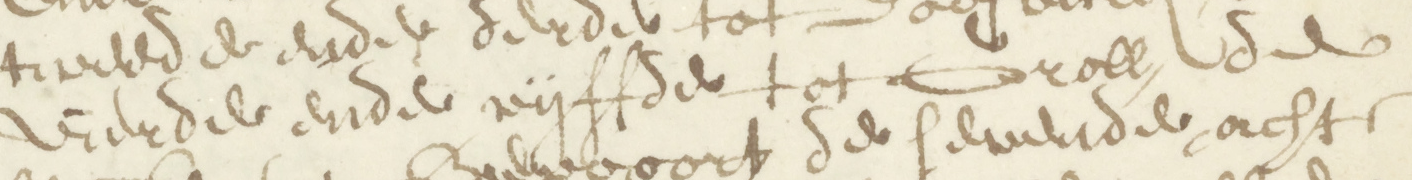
vierde ende vijffde tot Groll, de
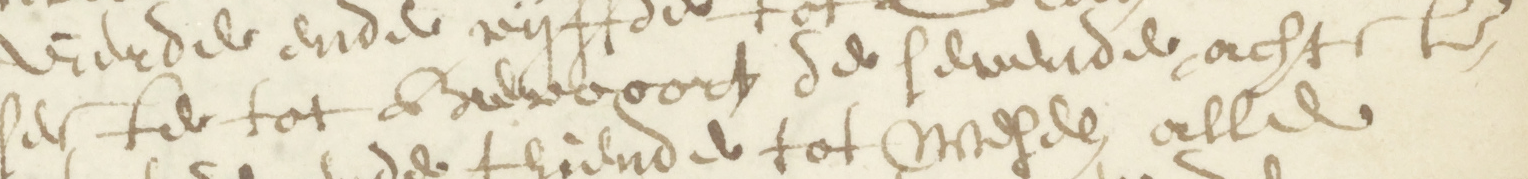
seste tot Brewoort de sevende, achtste,
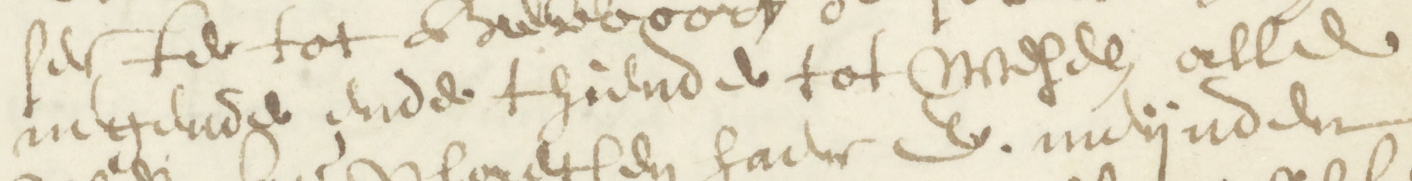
negende ende thiende tot Wesel alle
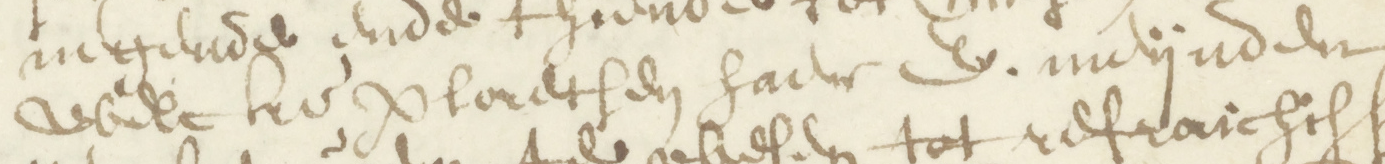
welcke plaetsen haer E. meijnden
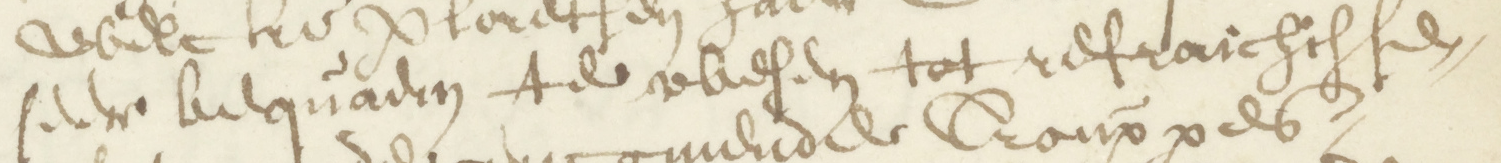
seer bequaem te wesen tot refraichisse„
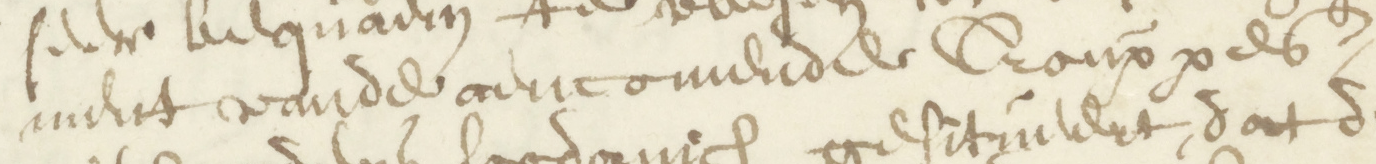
ment vande aencomende Trouppes,
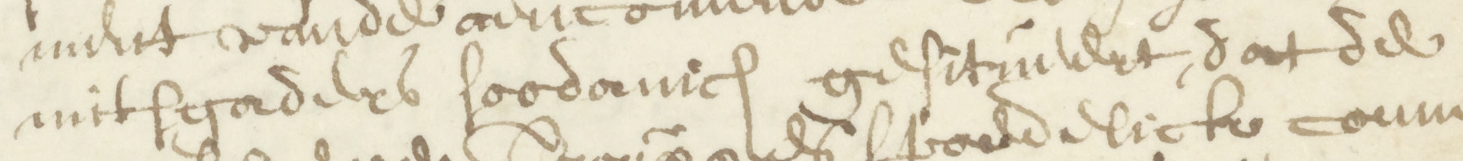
mitsgaders soodanich gesitueert, dat de
